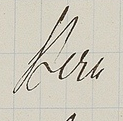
samen
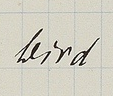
Berlin
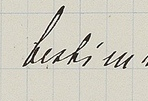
dort im
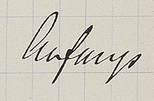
richtigen
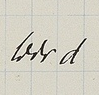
Moment
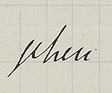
herzlichem
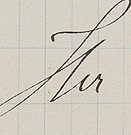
Bern
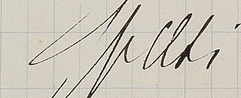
den 19 Febr.
